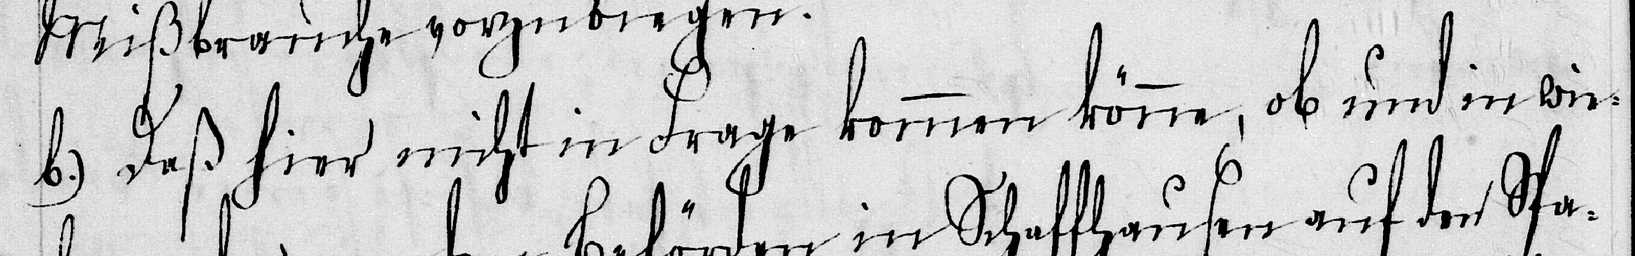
b.) Daß hier nicht in Frage kommen könne, ob und in wie¬
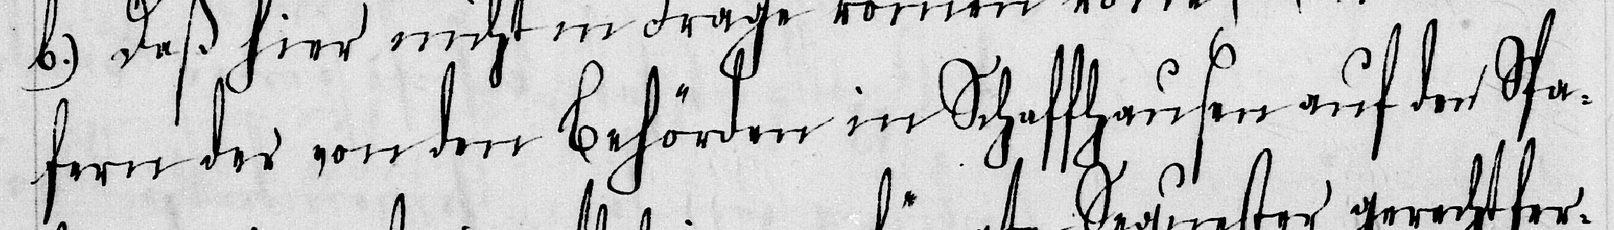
fern der von den Behörden in Schaffhausen auf den Spa¬
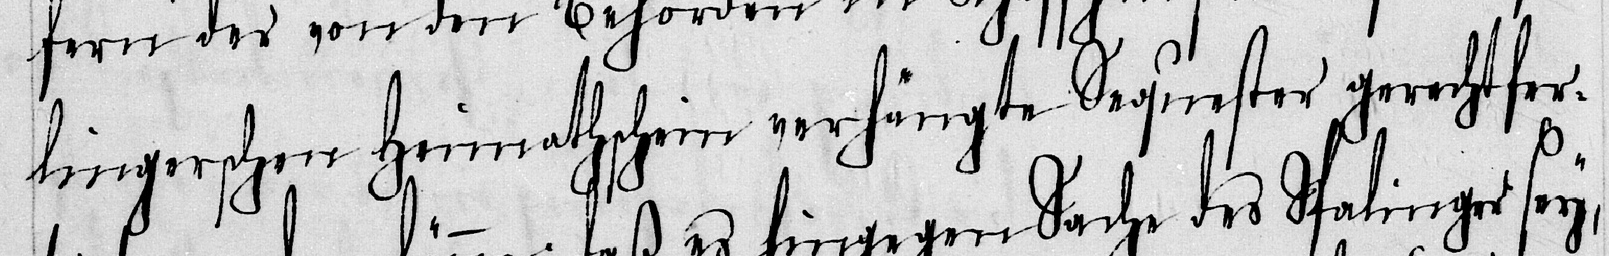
lingerschen Heimathschein verhängte Inquester gerechtfer¬
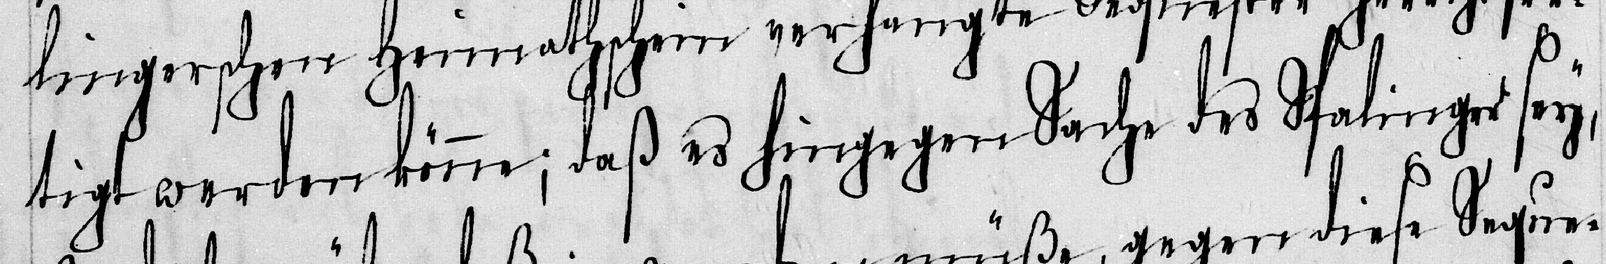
tigt werden könne; daß es hingegen Sache des Spalinger sey,
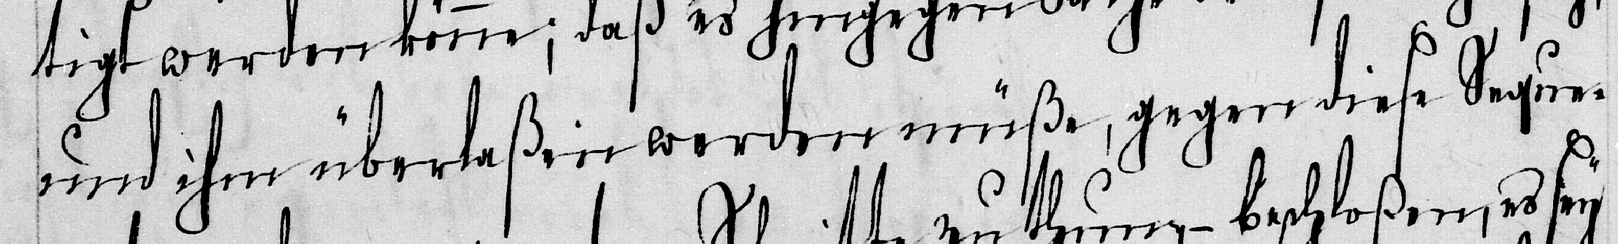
und ihm überlaßen werden müße, gegen diese Inque¬
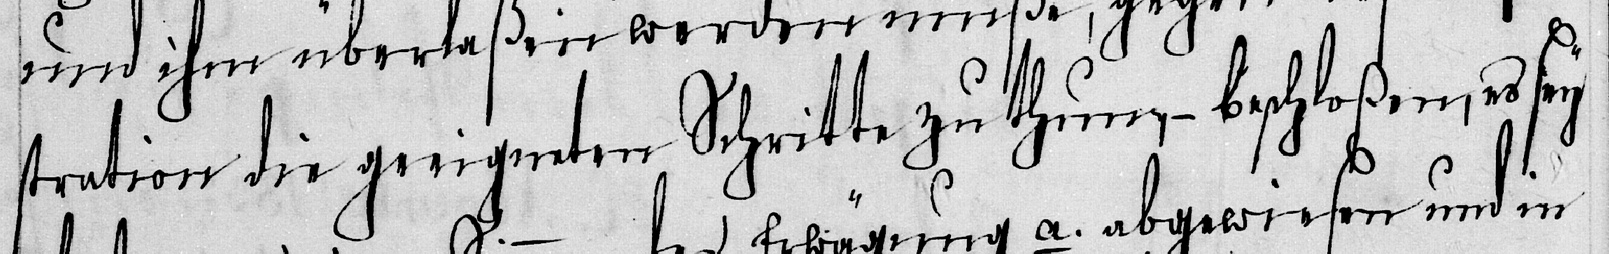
stration die geeigneten Schritte zu thun, – beschloßen, es sey
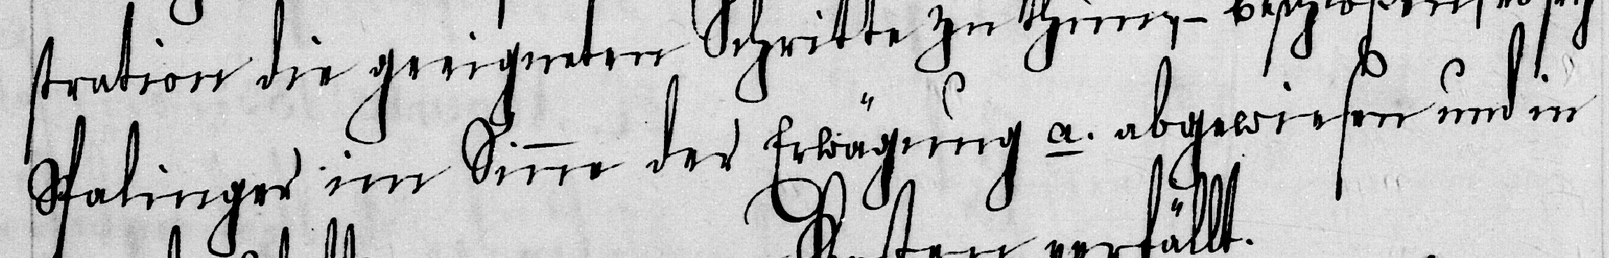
Spalinger im Sinne der Erwägung a. abgewiesen und in
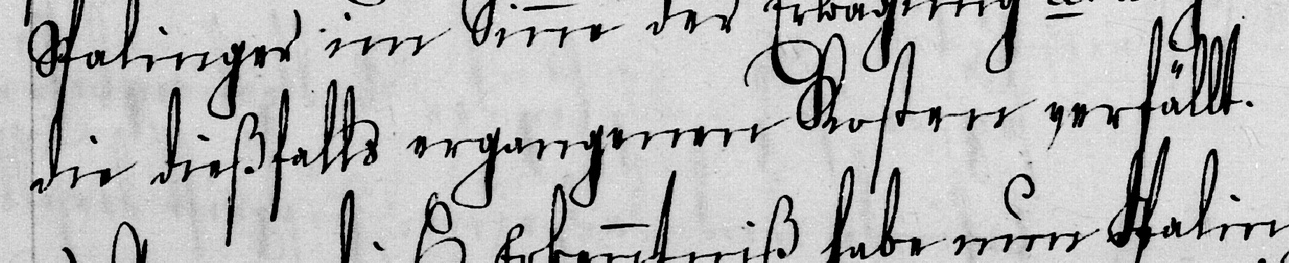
die dießfalls ergangenen Kosten verfäll¬
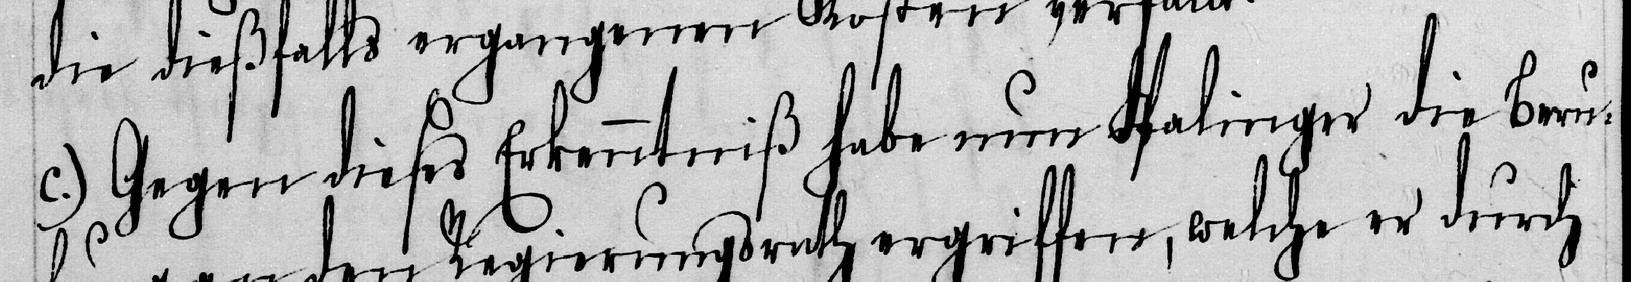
C.) Gegen dieses Erkenntniß habe nun Spalinger die Beru¬
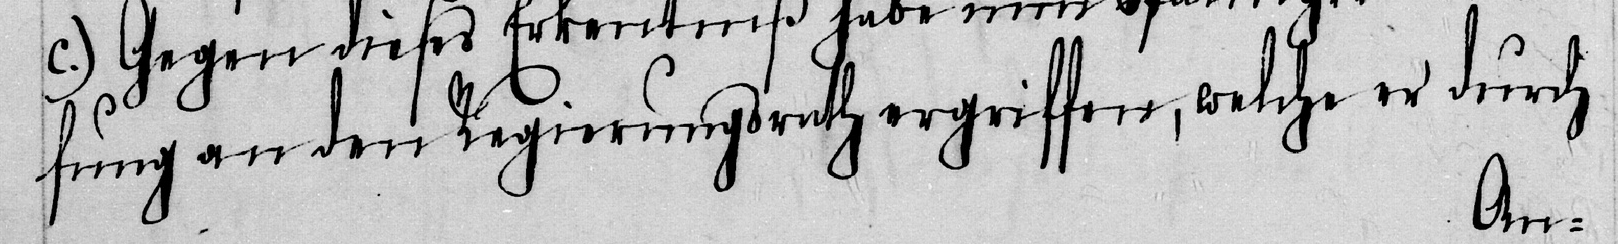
fung an den Regierungsrath ergriffen, welche er durch
